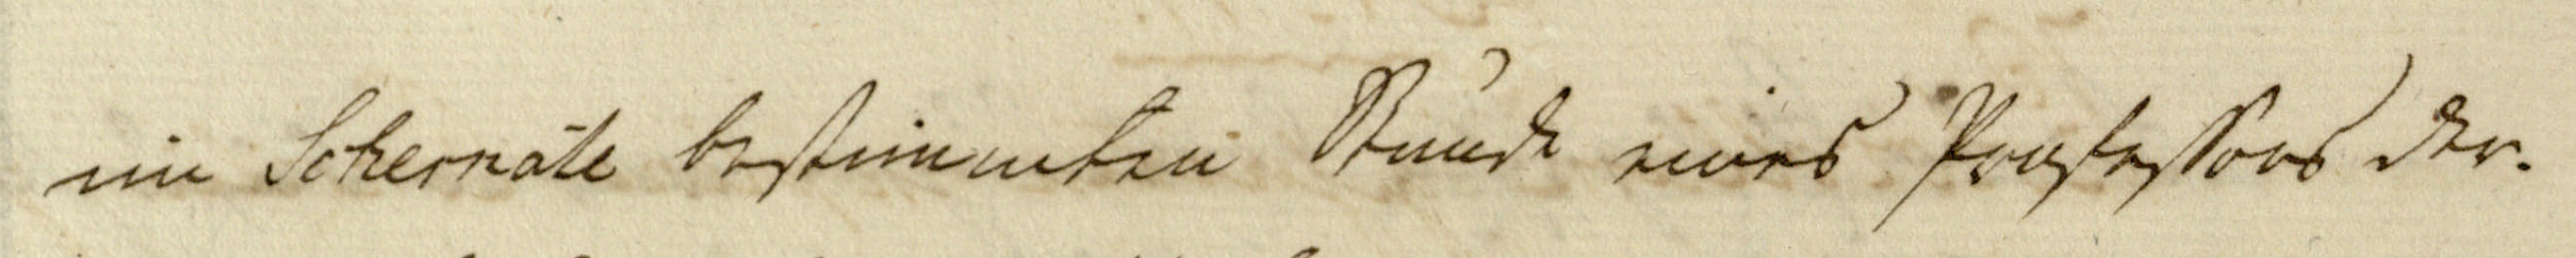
im Schemate bestimmten Stunde eines Professors der¬
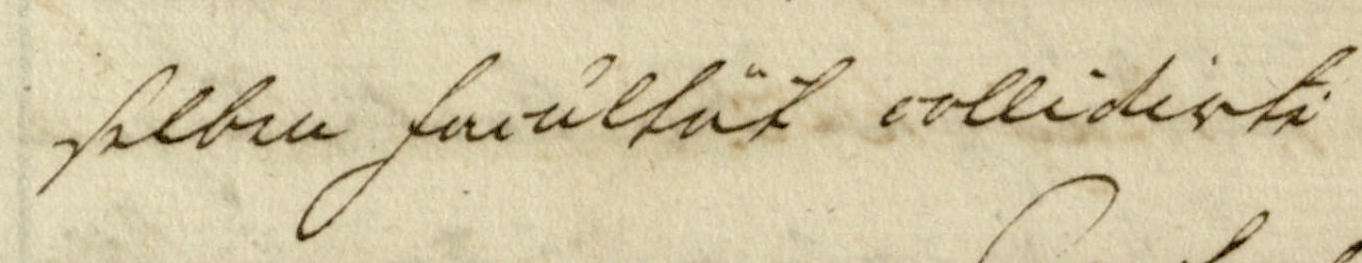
selben Facultät collidirte.
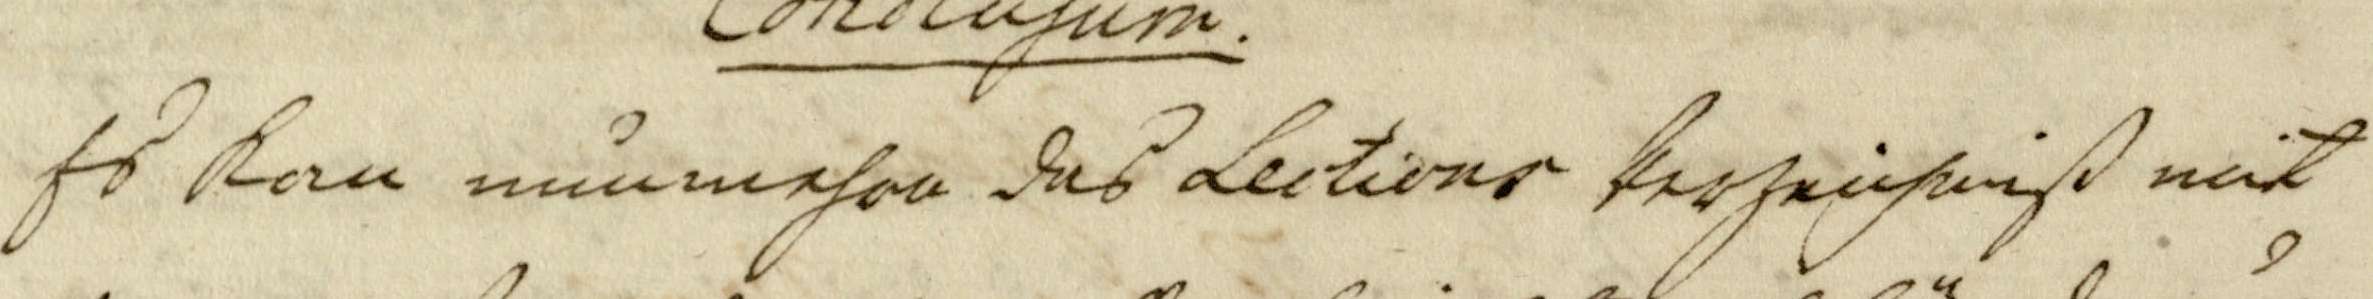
Es kan nunmehro das Lections Verzeichniß mit
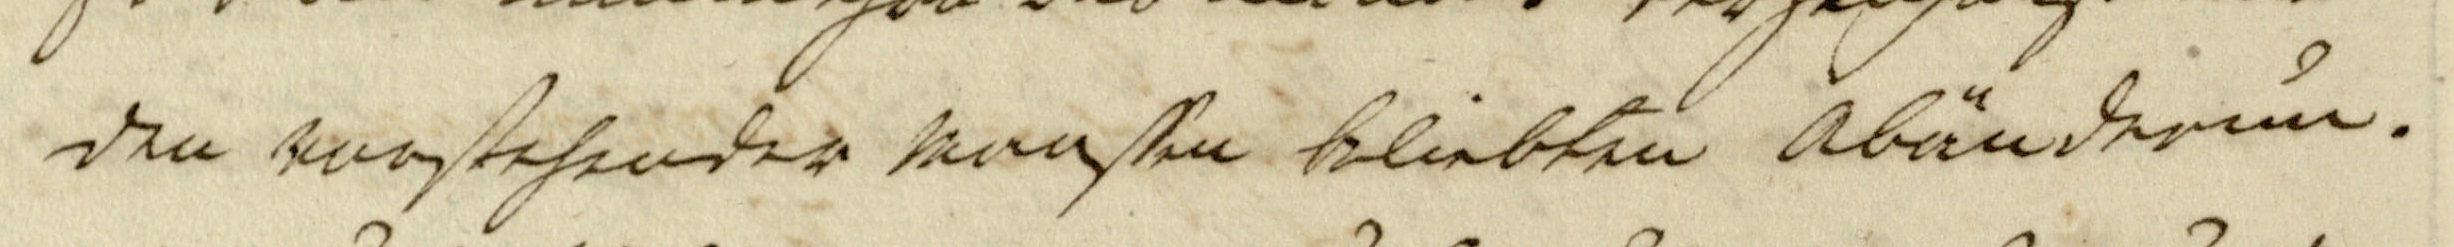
den vorstehender Maassen beliebten Abänderun¬
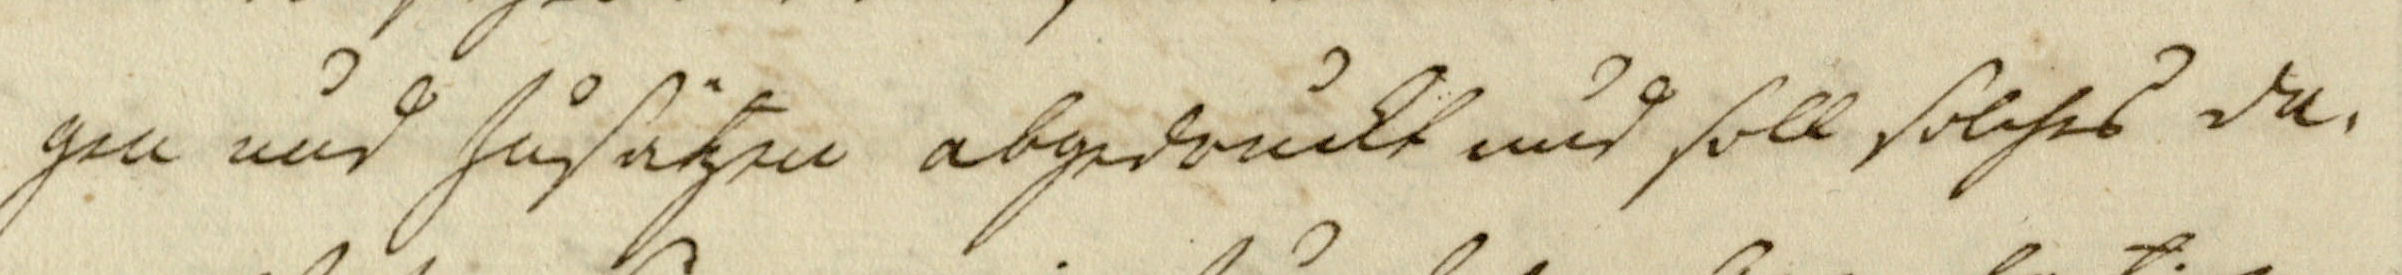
gen und Zusätzen abgedruckt und soll solches da¬
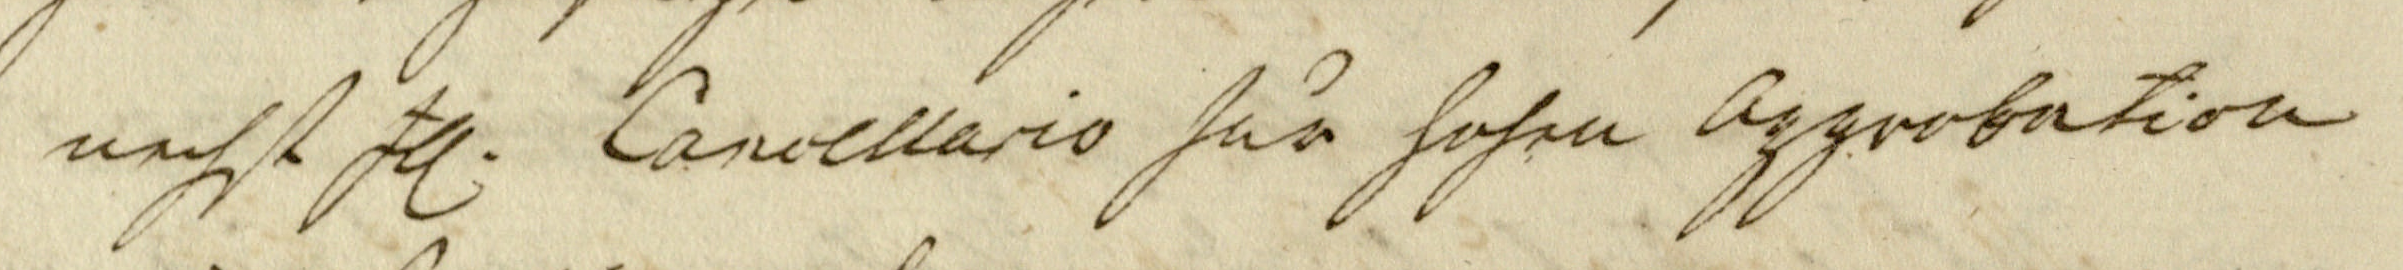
nechst Ill. Cancellario zur hohen Approbation
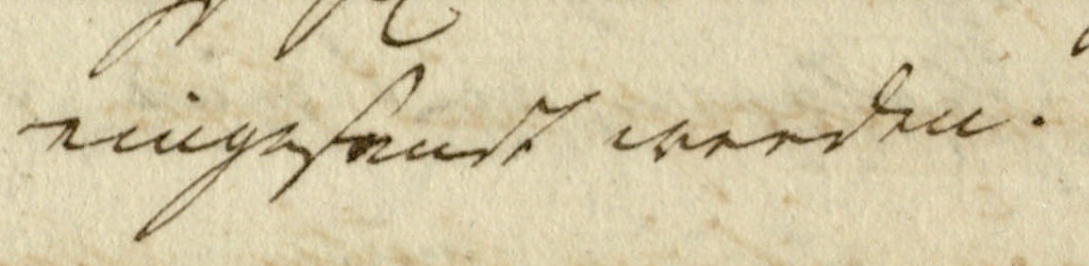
eingesandt werden.
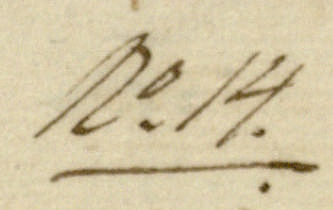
No 14.
